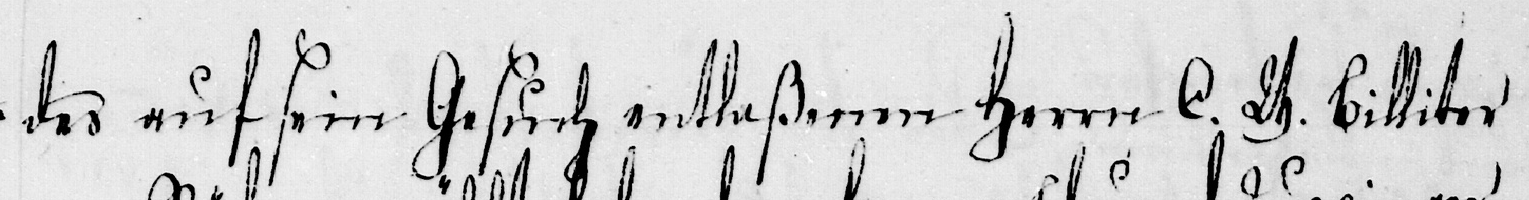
des auf sein Gesuch entlaßenen Herrn C. W. Billiter
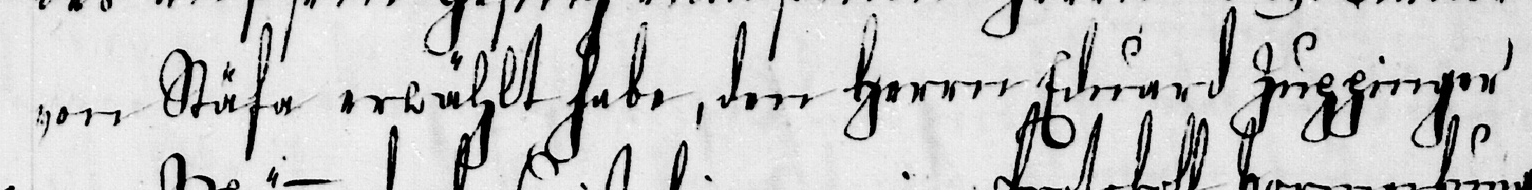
von Stäfa erwählt habe, den Herrn Eduard Zuppinger
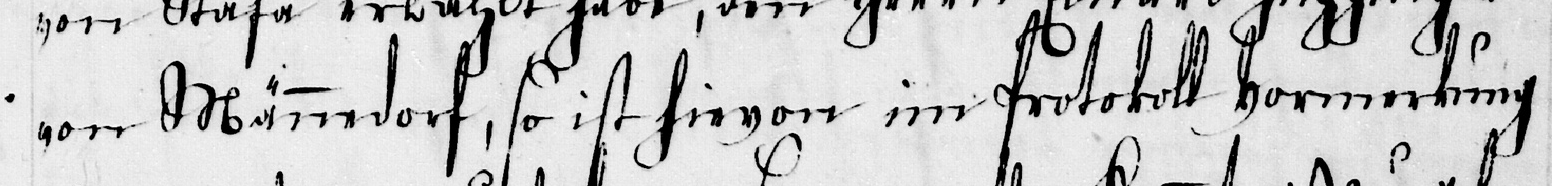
von Männedorf, so ist hievon im Protokoll Vormerkung
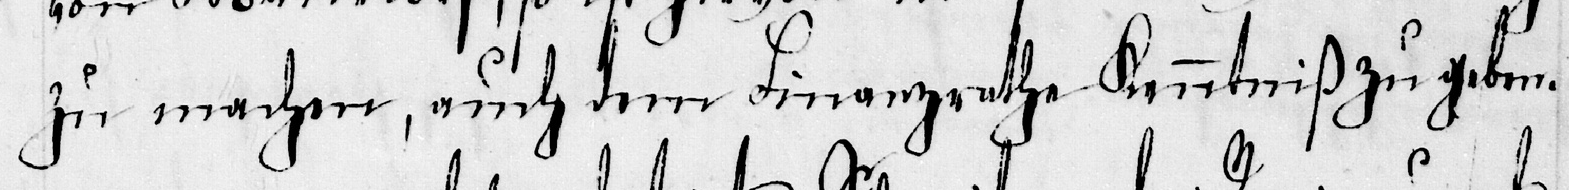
zu machen, auch dem Finanzrathe Kenntniß zu geben.
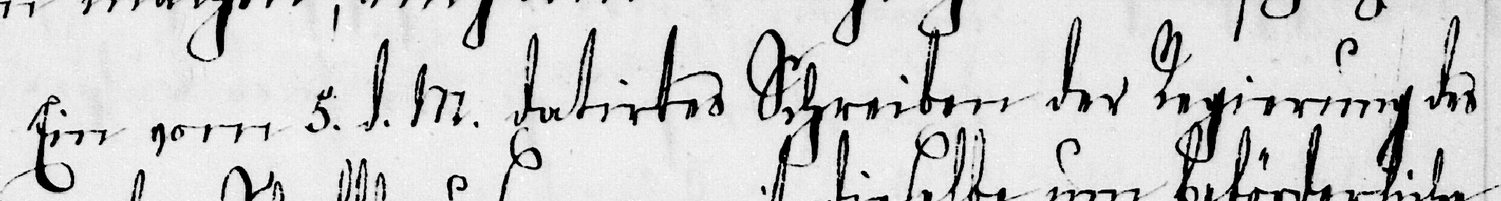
Ein vom 5. d. M. datirtes Schreiben der Regierung des
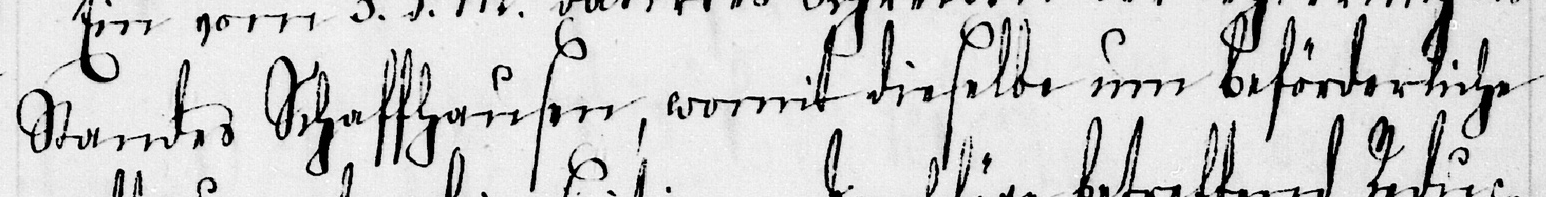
Standes Schaffhausen, womit dieselbe um beförderliche
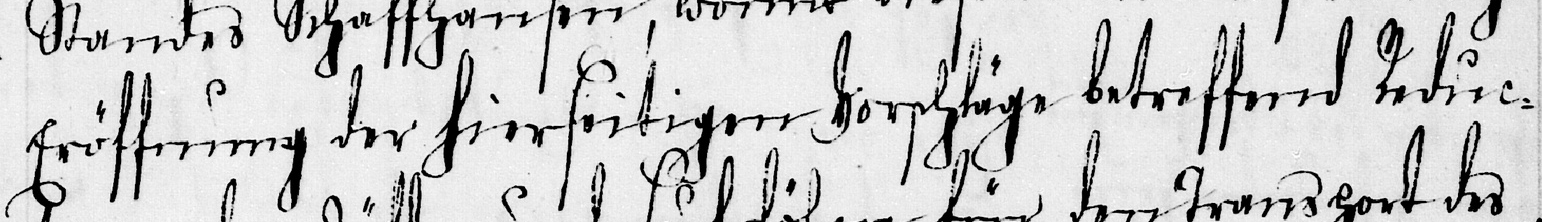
Eröffnung der hierseitigen Vorschläge betreffend Reduc¬
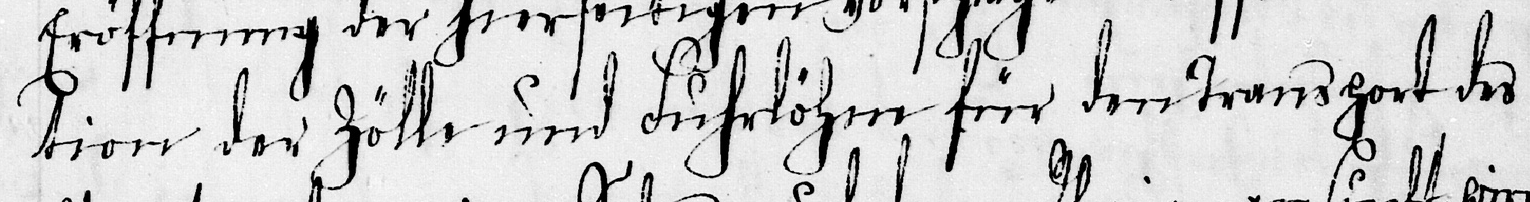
tion der Zölle und Fuhrlöhne für den Transport des
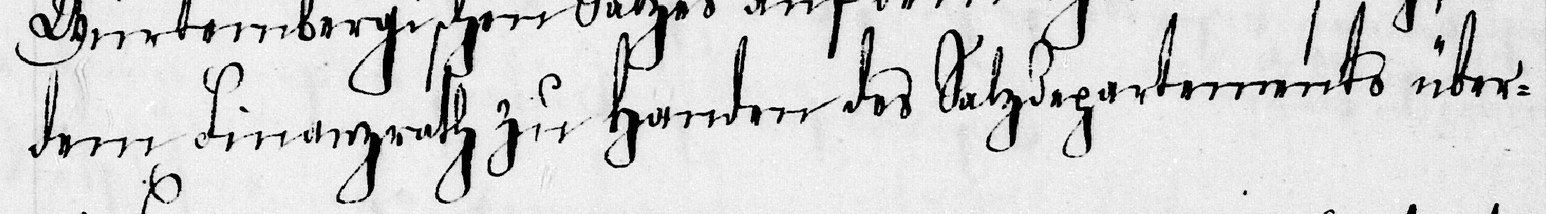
dem Finanzrathe zu Handen des Salzdepartements über¬
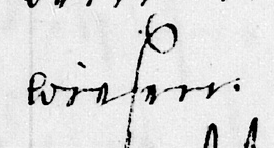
wiesen.
